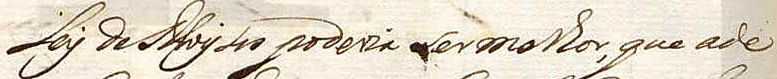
Ley de Moyses, poderia ser melhor que a de
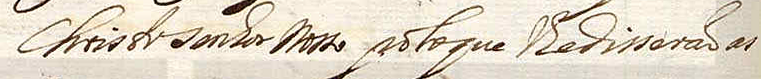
Christo senhor Nosso polo que lhe disseraõ as
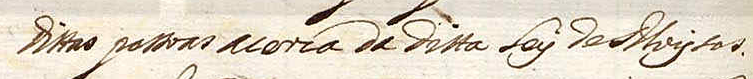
dittas pessoas acerca da ditta Ley de Moyses.
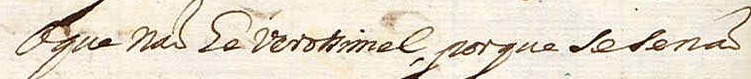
O que não he verossimel, porque se se não
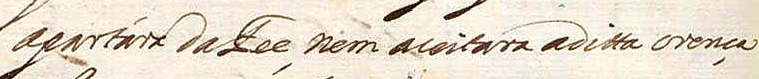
apartára da Fee, nem aceitara a ditta crença
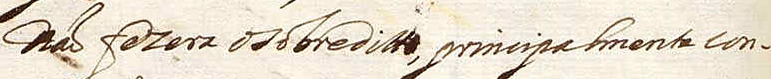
naõ fezera o sobreditto, principalmente con
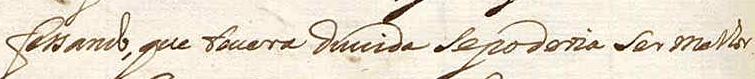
fessando, que teuera duuida se poderia ser melhor
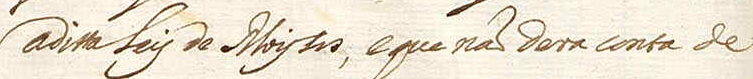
a ditta Ley de Moyses, e que não dera conta de
